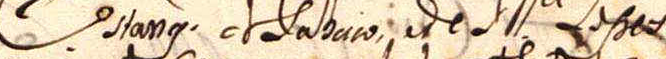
Estanq.ro d̄ Tabaco, e de M.a Lopes
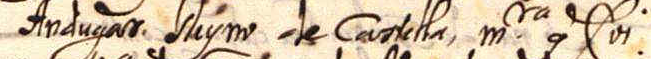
Andugar. Reyno de Castella, m.ra q̄ foi
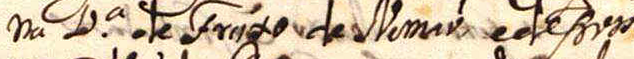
na V.a de Freixo de Nemaõ, e depois
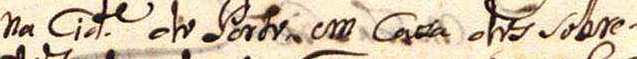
na Cid̄.e do Porto em Caza dos sobre
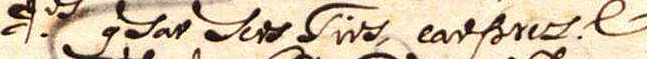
d̄.os q̄ saõ seos Tios, e ao prez.e
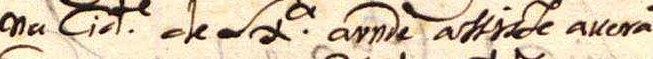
na Cid̄.e de Lx.a aonde assiste auerá
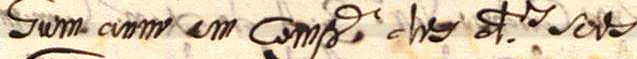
hum anno em Compa dos d̄.os seos
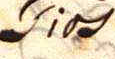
Tios.
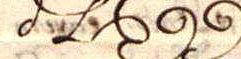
d̄ 1699.
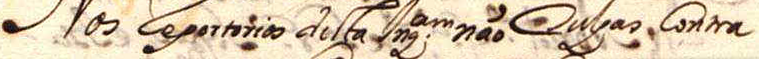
Nos Reportorios desta Inq.am naõ Culpas Contra
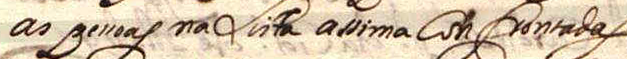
as pessoas na Lista assima Confrontadas
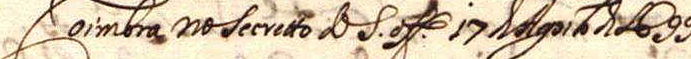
Coimbra no Secretto do S. off.o i7 de Agosto de 1699
